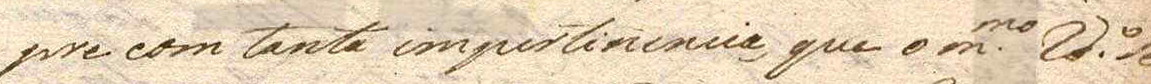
pre com tanta impertinencia, que o m.mo Rd.o se
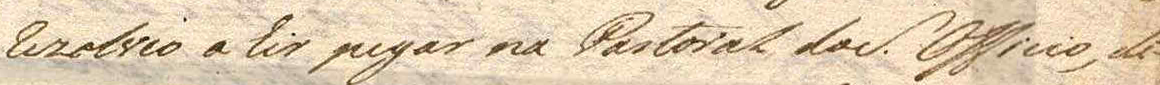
Rezolveo o hir pegar na PastoraL do S. Officio, di
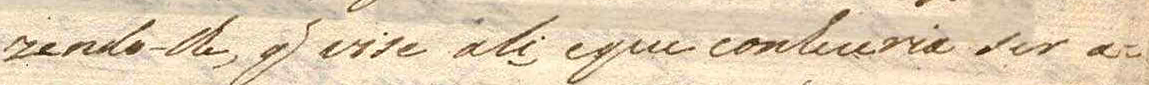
zendo-lhe, q̄ vise ali, e que conheceria ser a
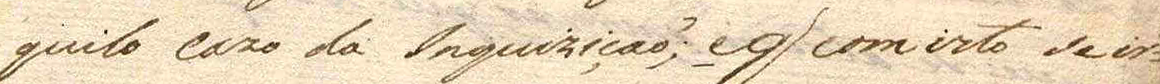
quilo cazo da Inquiziçaõ, e q̄ com izto se ir
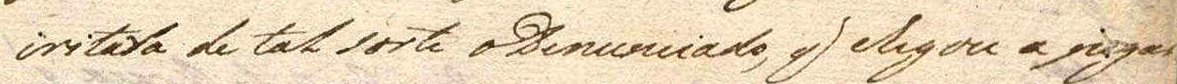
iritara de taL sorte o Denunciado, q̄ chegou a pegar
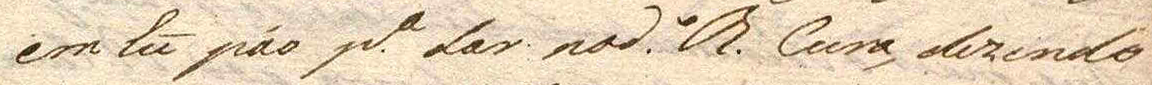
em hū páo p.a dar no d.o R. Cura, dizendo
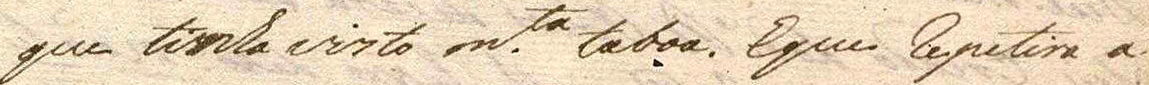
que tinha visto m.ta taboa. E que Repetira a
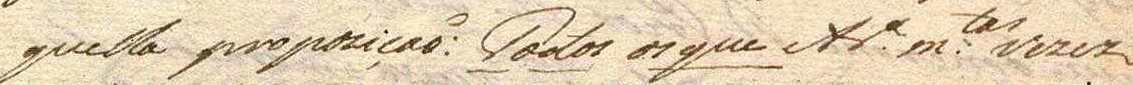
quella propoziçaõ: Todos os que Ar.a m.tas vezez
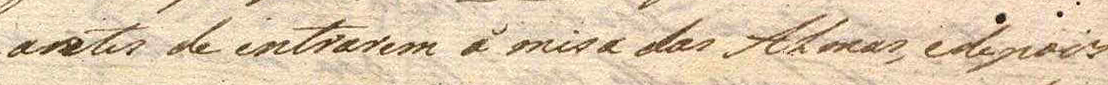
antez de entrarem á misa das Almas, e depoiz
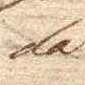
da
